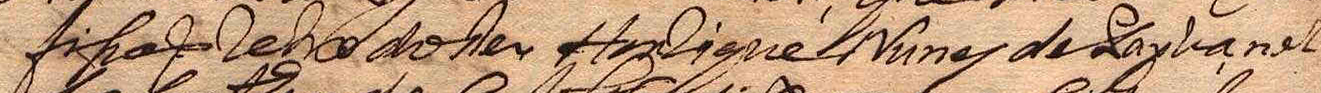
fissaõ Retro do Reo Henrique Nunes de Payva, nel
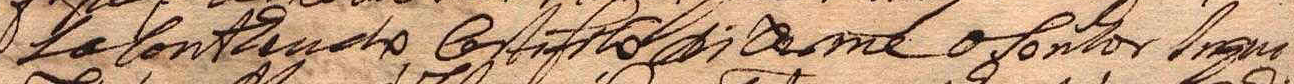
la contheudo Certifico dizerme o senhor Inqui
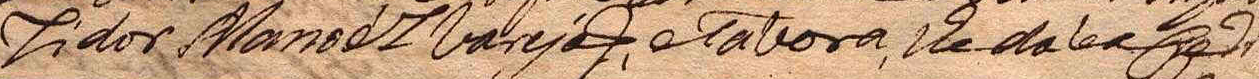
Zidor Manoel Varejaõ, e Tavora, lhe dava Credi
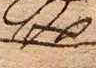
to
